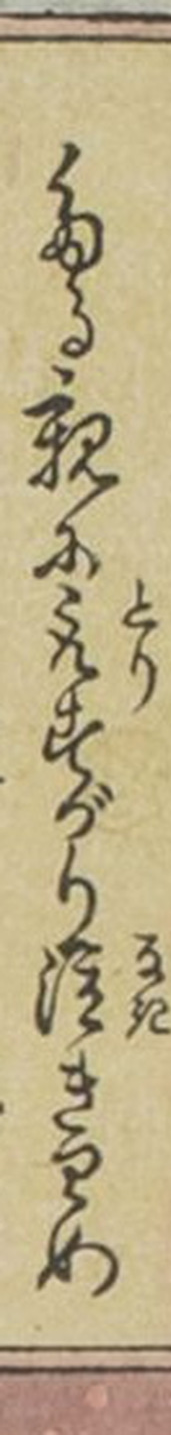たる親に取すがり泣きわめ
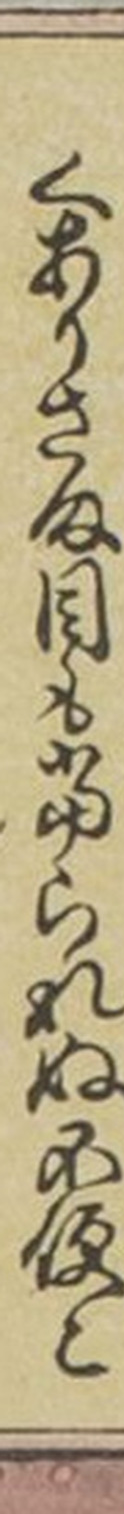くありさま目も当られぬ不便と
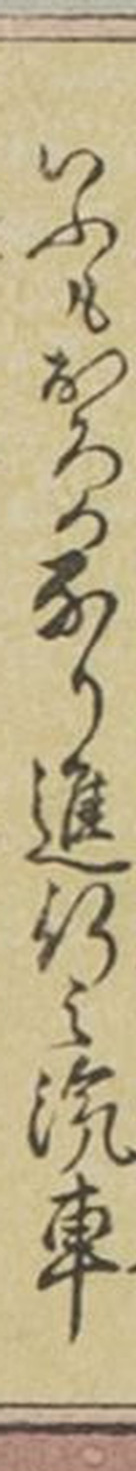いふもおろかなり進行之汽車
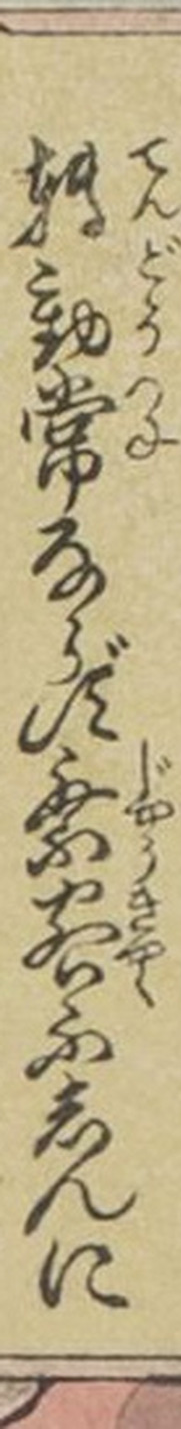転動常ならず乗客ふしんに
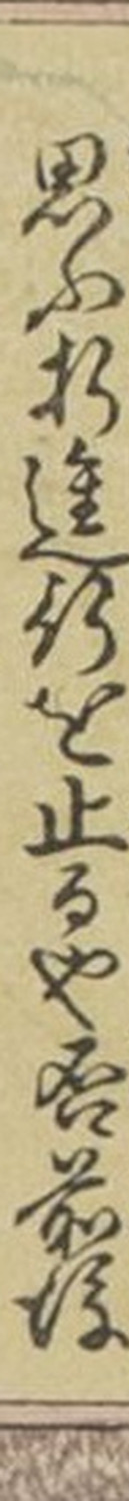思ふ折進行を止るや否前後
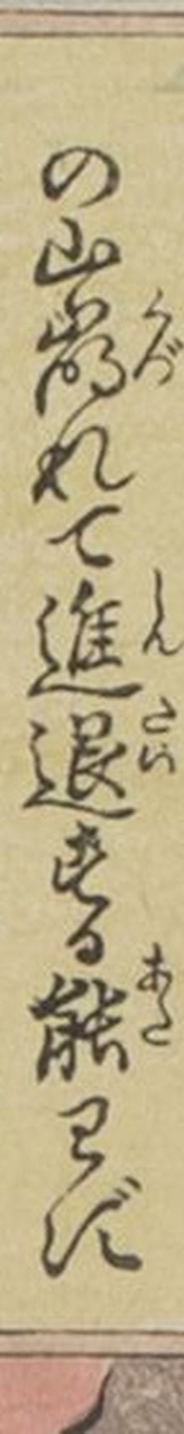の山崩れて進退する能わず
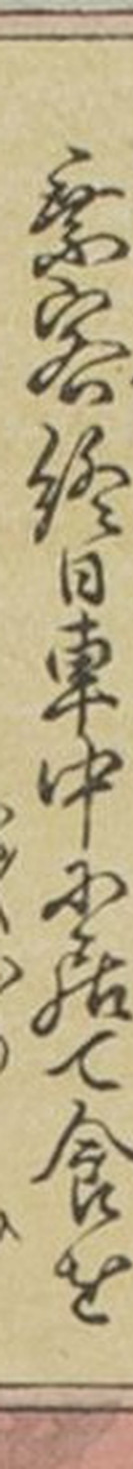乗客終日車中に居て食を
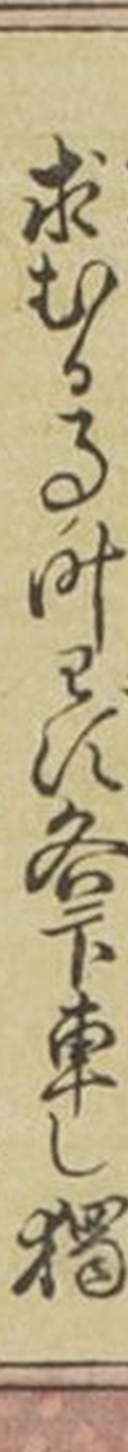求むる事叶わず各下車し独
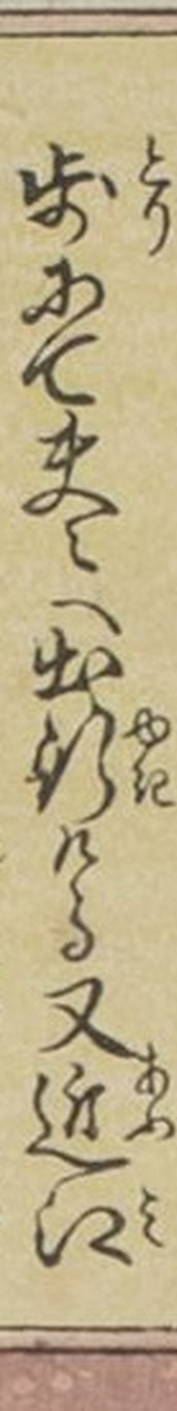歩にて夫々へ出行ける又近江
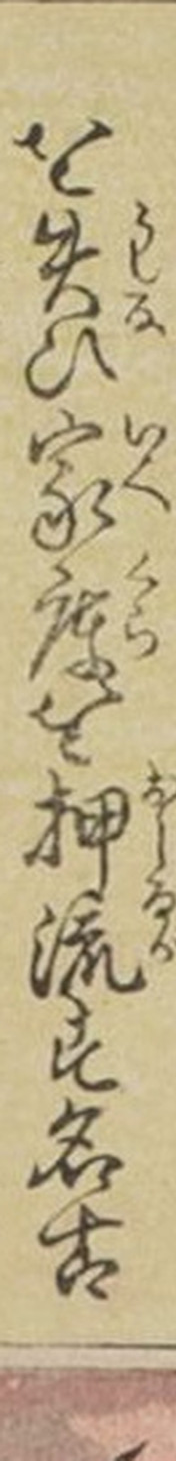を失ひ家庫を押流す名古
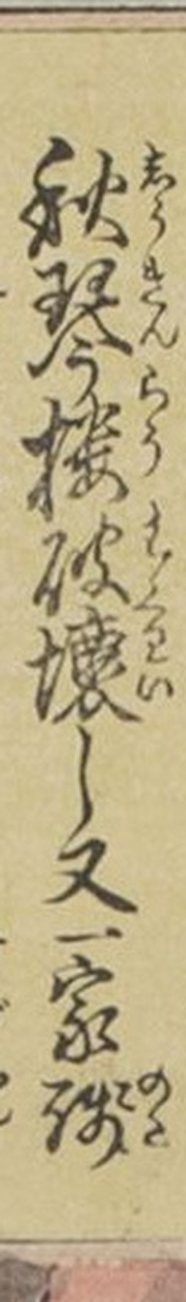秋琴楼破壊し又一家残
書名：濃尾大地震図
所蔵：あいおいニッセイ同和損保株式会社
